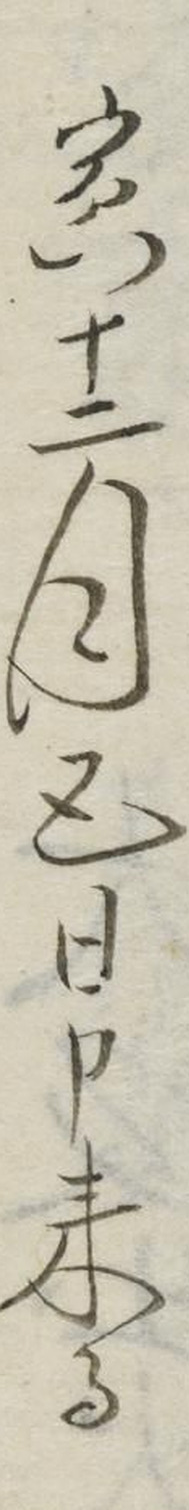寅十二月五日申来る
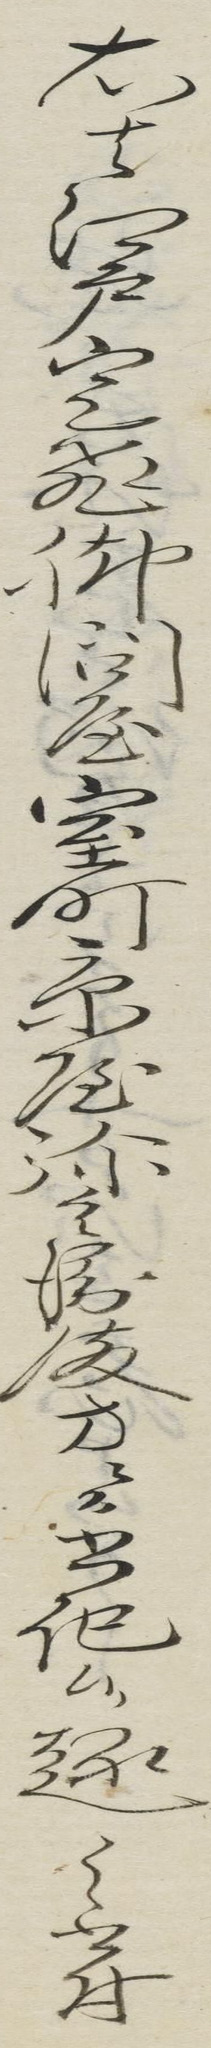右は江戸定飛脚問屋室町京屋弥兵衛殿方ニ而書記候趣之書付
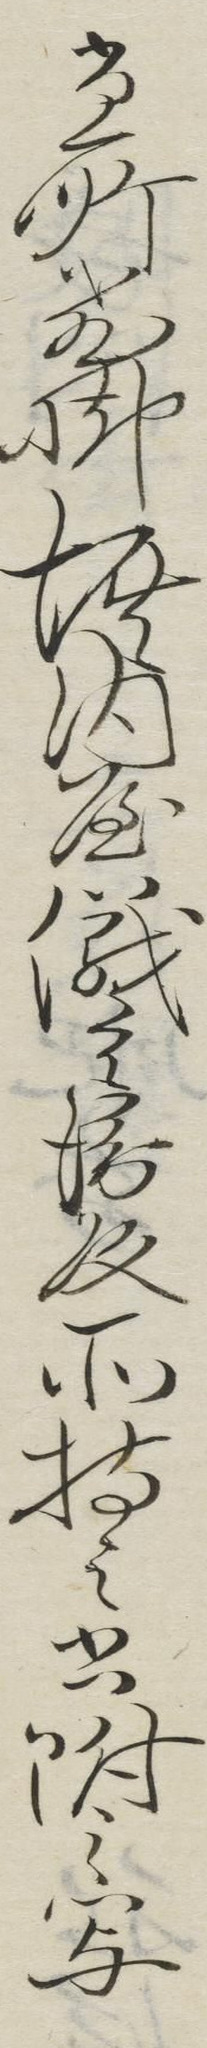当所飛脚堀内屋儀兵衛殿所持之書附之写
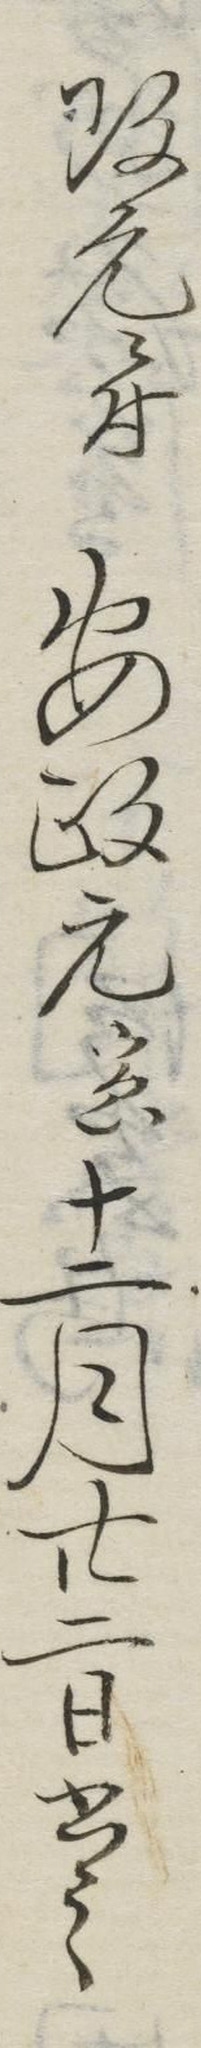改元ニ付安政元寅十二月廿二日書之
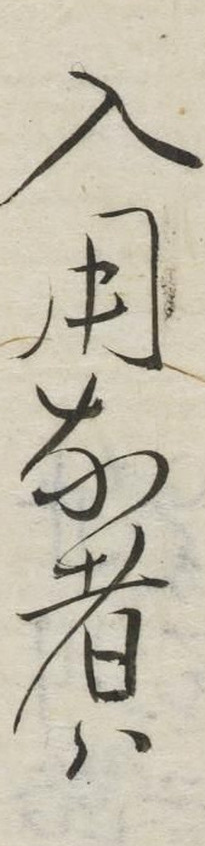入用な者ハ
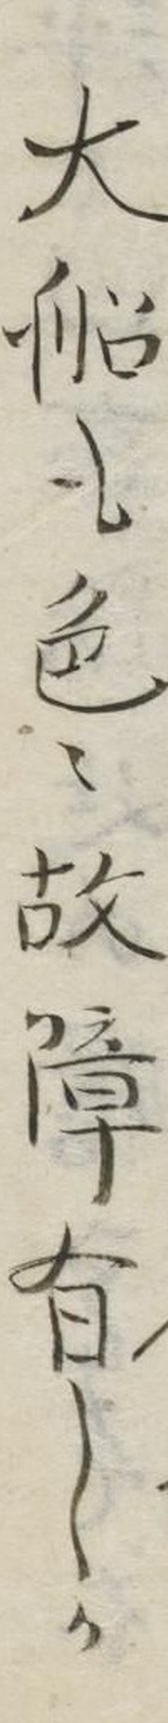大船も色〻故障有しか
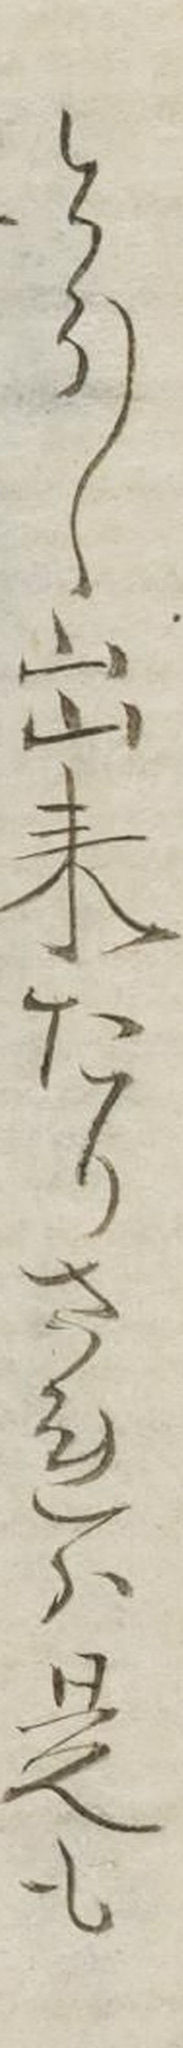そろ〳〵出来たりされハ是も
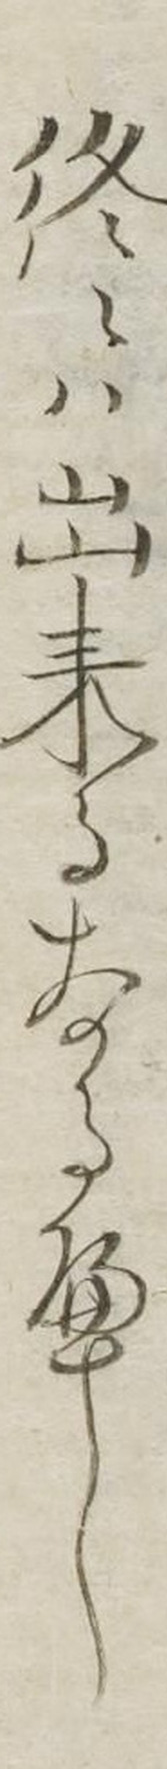終ニハ出来るなるへし
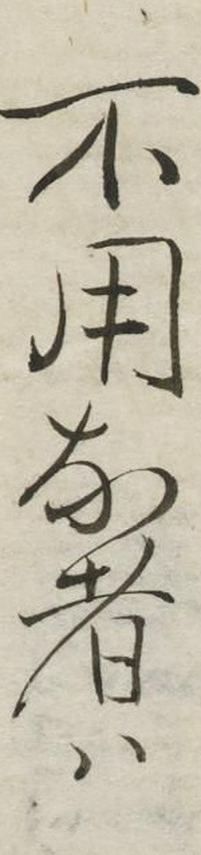不用な者ハ
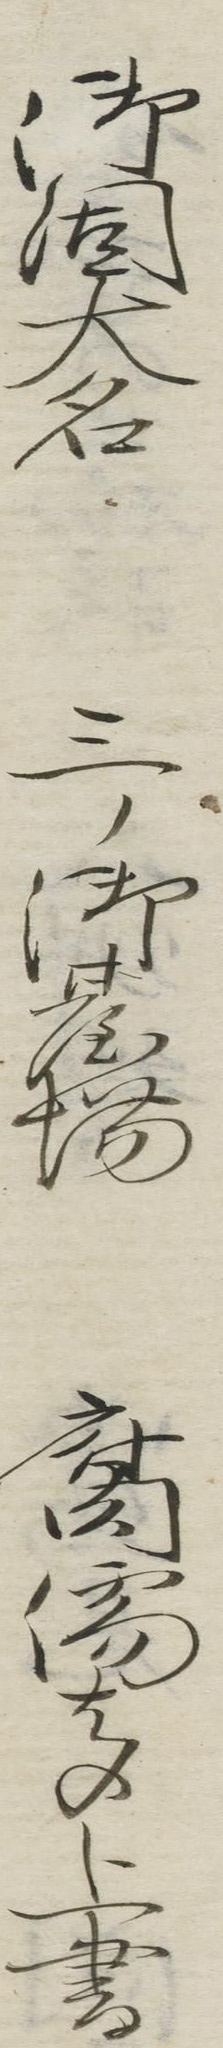御固大名三ノ御台場腐儒者の上書
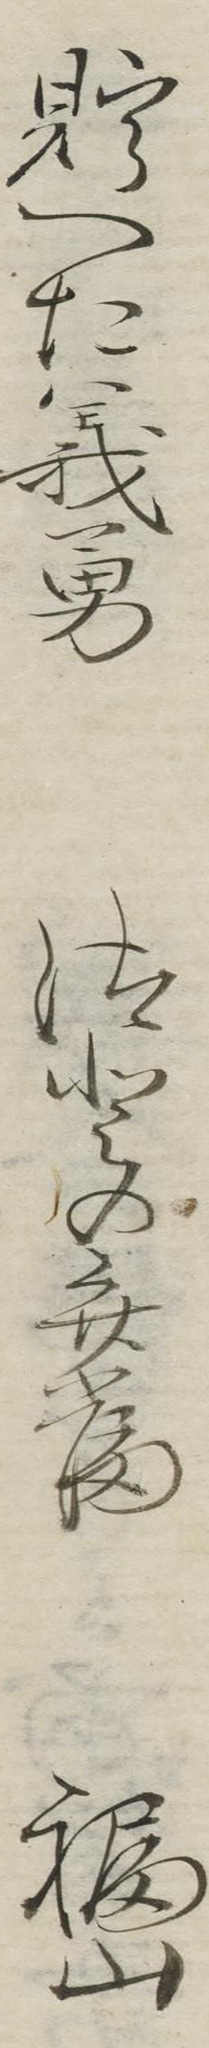貯へた義勇御登の弁当福山
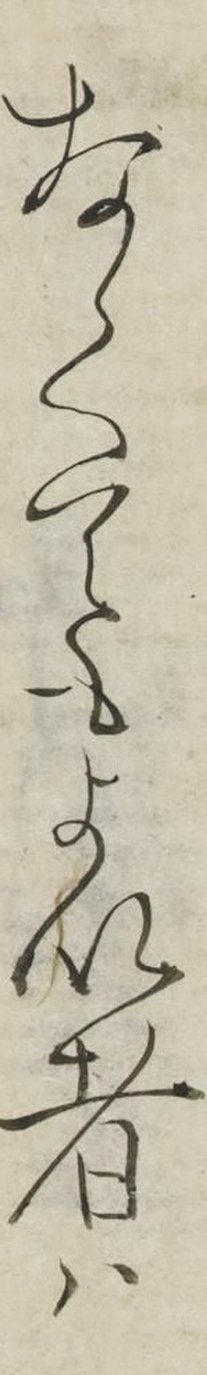なくてもよい者ハ

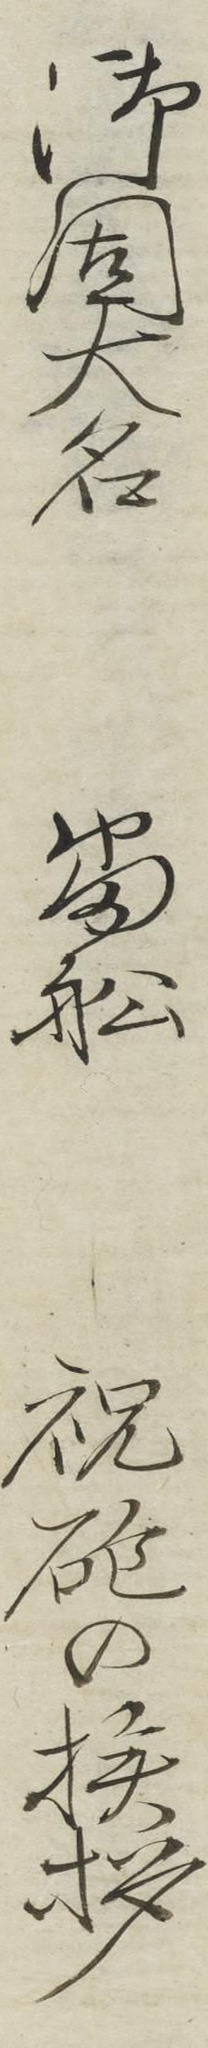御固大名番船祝砲の挨拶
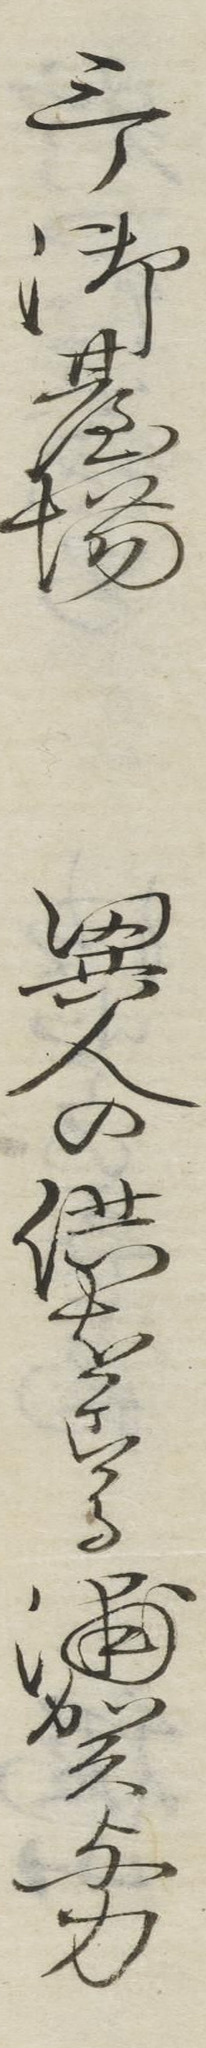三ノ御台場異人の供をする浦賀与力
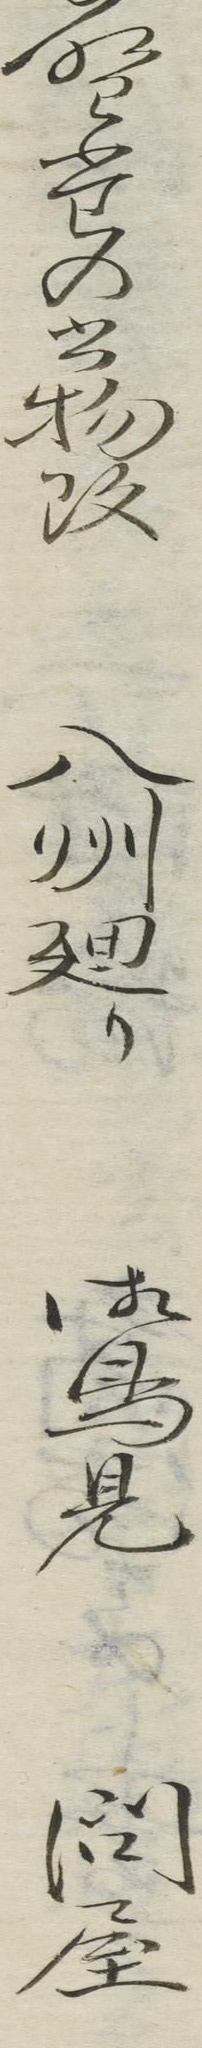敬王堂の書物改八州廻り御鳥見問屋
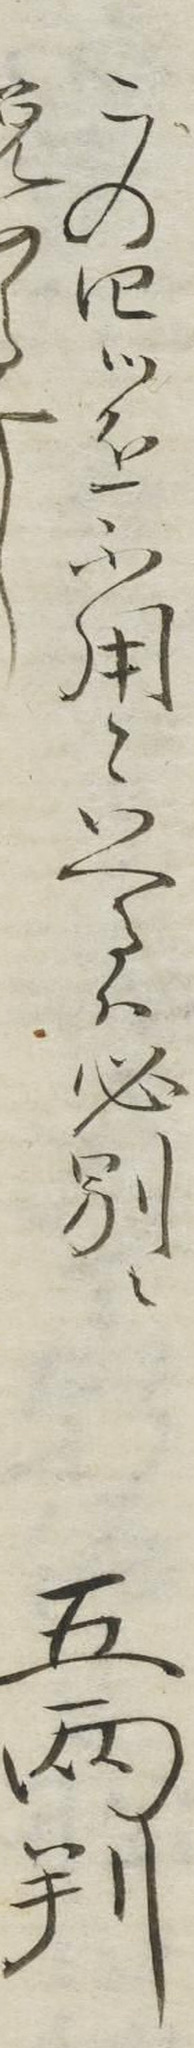この四ツを不用といへるハ必別ニ五両判
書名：大地震實録
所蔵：東京大学地震研究所図書室 Earthquake Research Institute Library, The University of Tokyo, JAPAN
